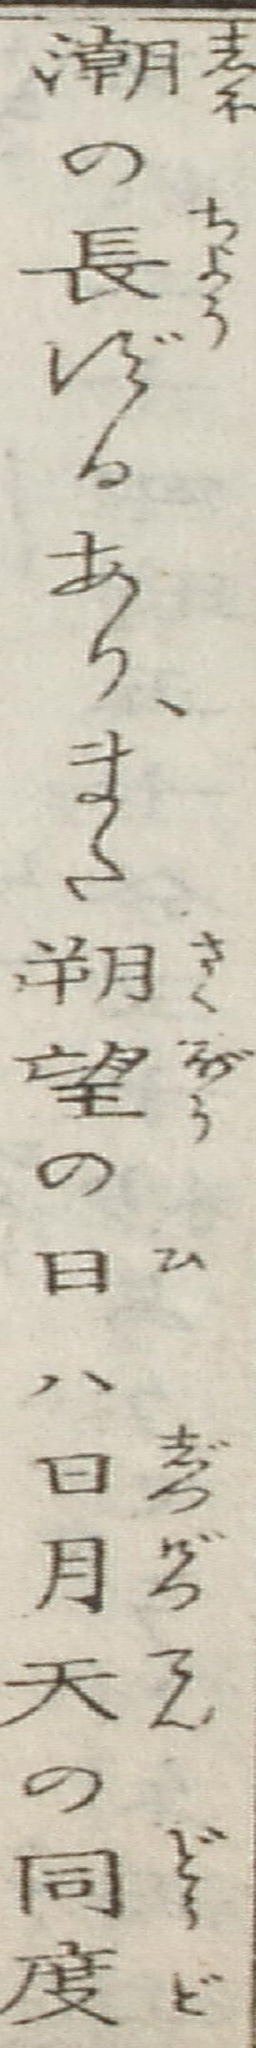潮の長ずるあり、また朔望の日は日月天の同度
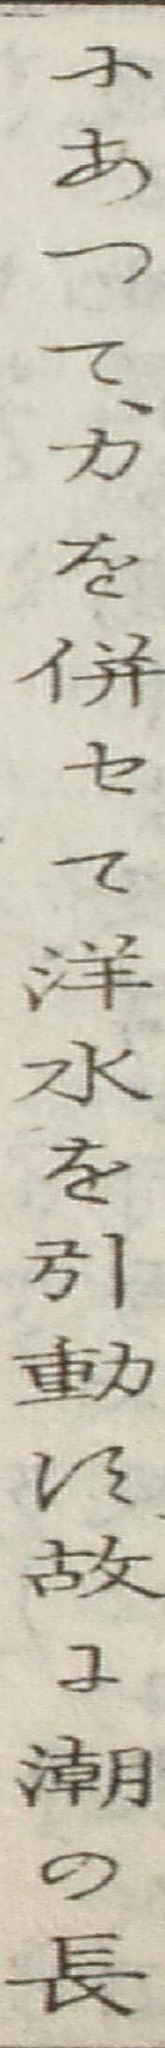にあつて、力を併せて洋水を引動す、故に潮の長
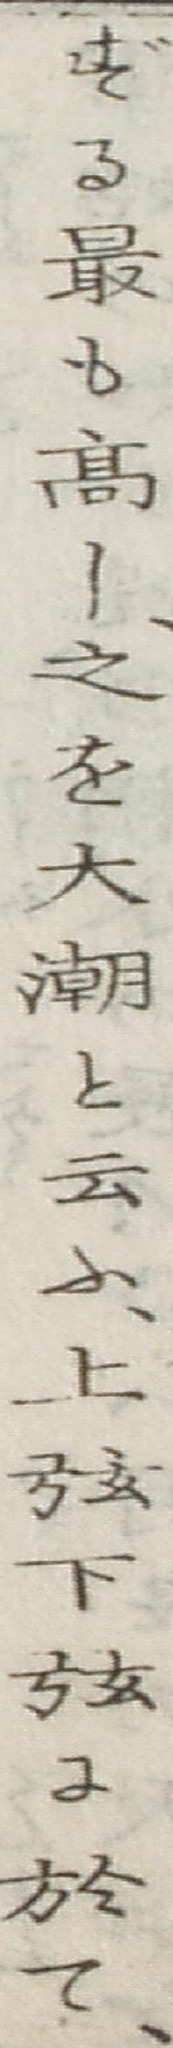ずる最も高し、之を大潮と云ふ、上弦下弦に於て、
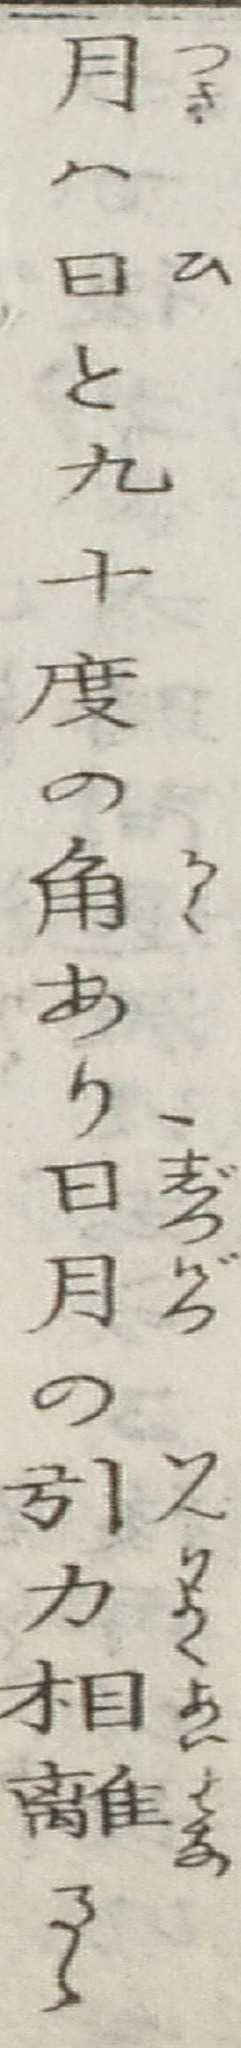月は日と九十度の角あり、日月の引力相離るゝ
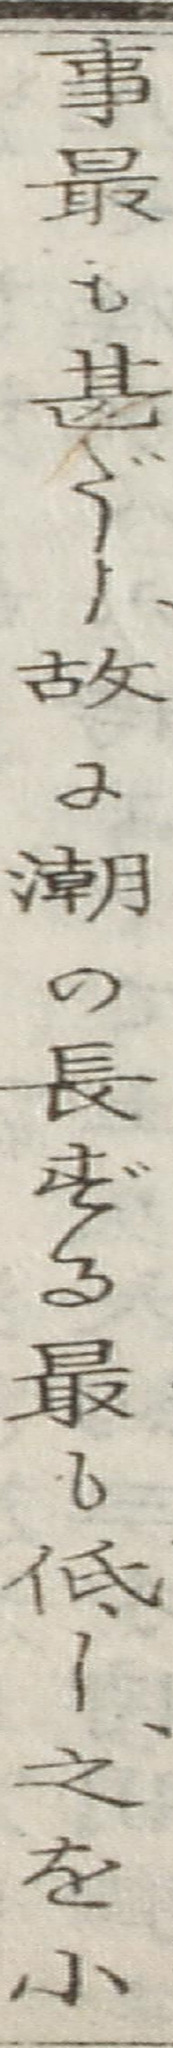事最も甚だし、故に潮の長ずる最も低し、之を小
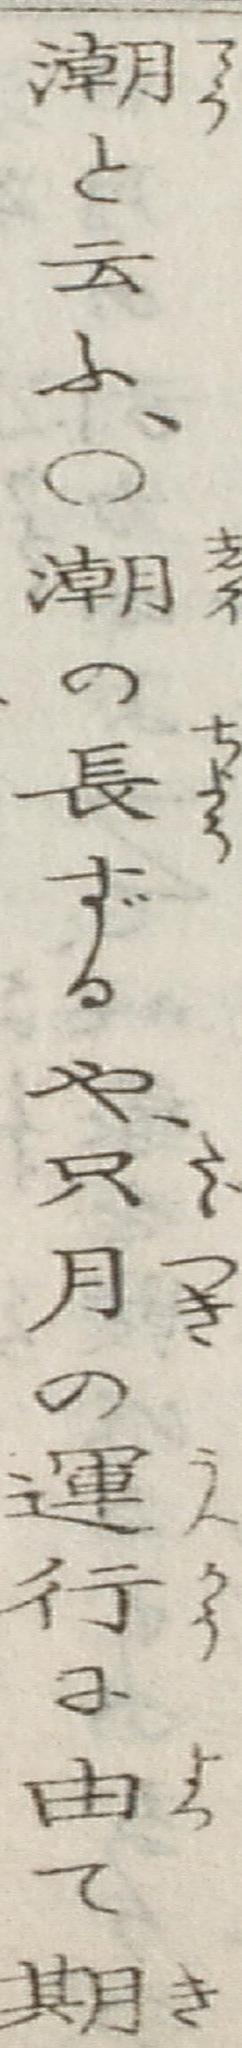潮と云ふ、○潮の長ずるや、只月の運行に由て期
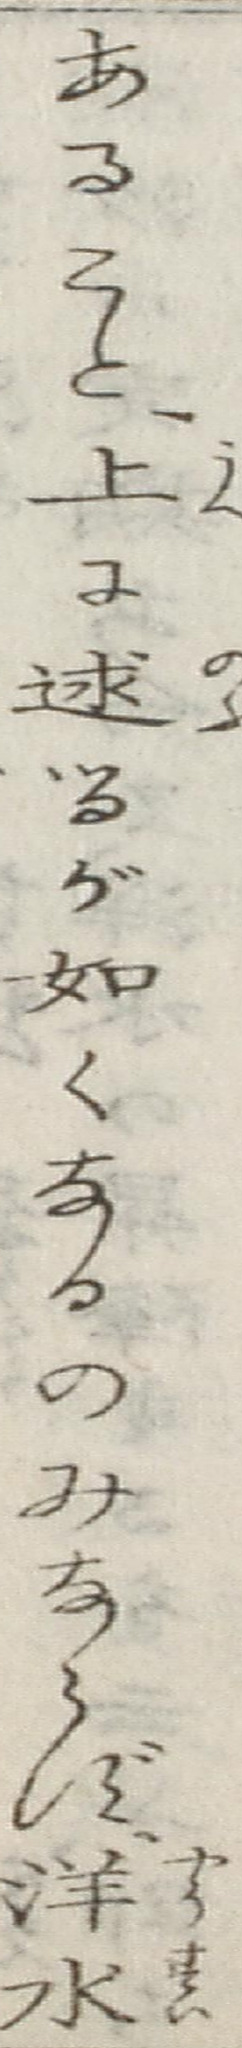あること、上に述るが如くなるのみならず、洋水
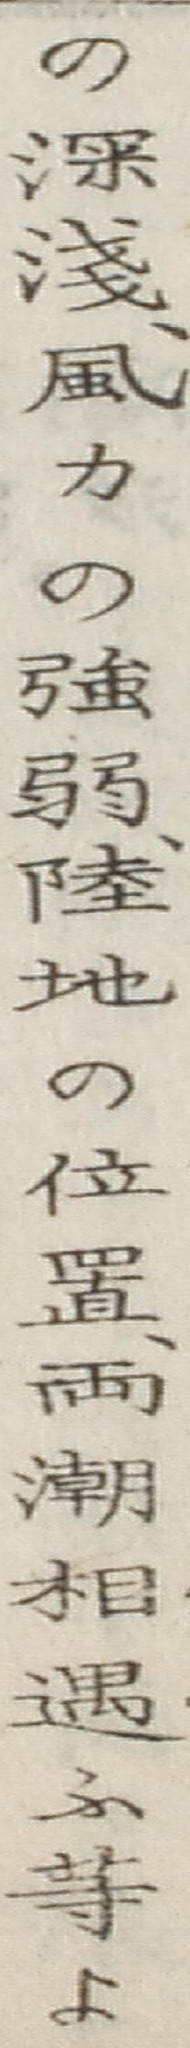の深浅、風力の強弱、陸地の位置、両潮相遇ふ等よ
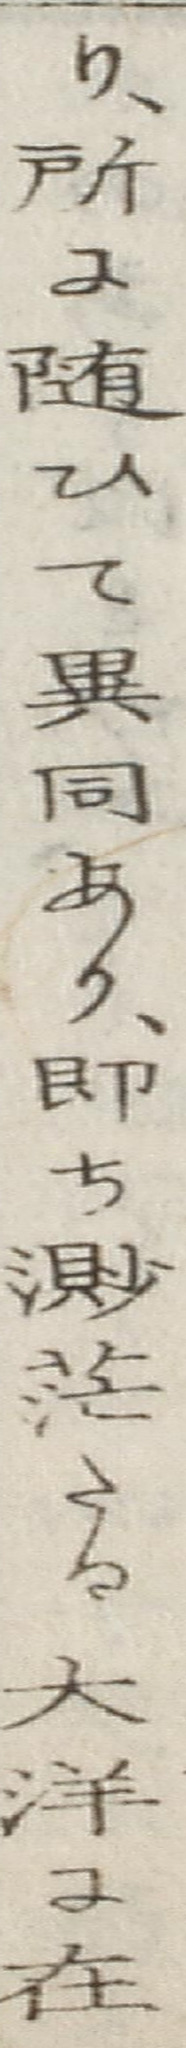り、所に随ひて異同あり、即ち渺茫たる大洋に在
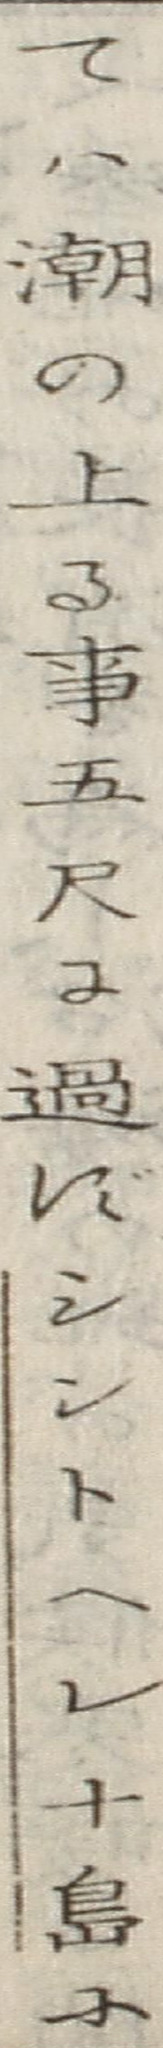ては、潮の上る事五尺に過ず、シントヘレナ島に
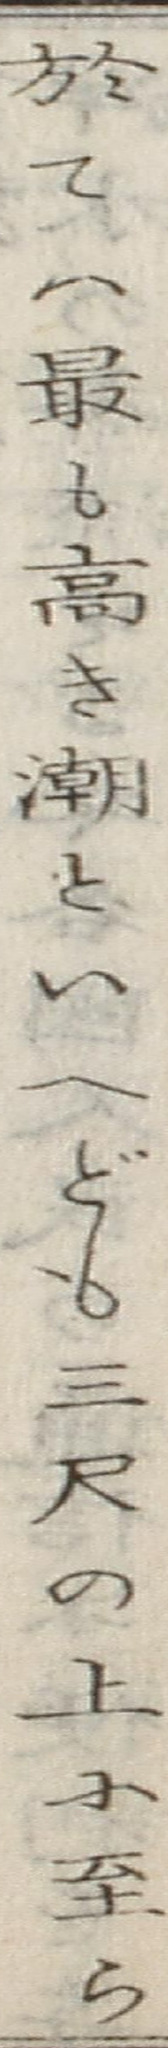於ては最も高き潮といへども、三尺の上に至ら
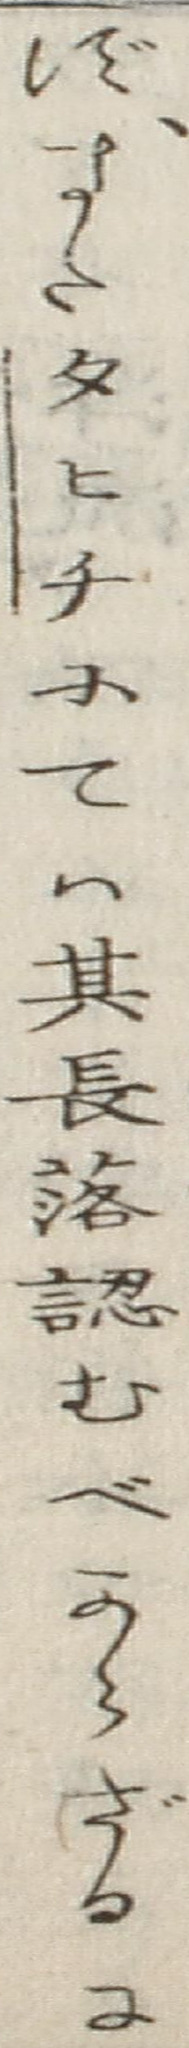ず、またタヒチにては其長落認むべからざるに
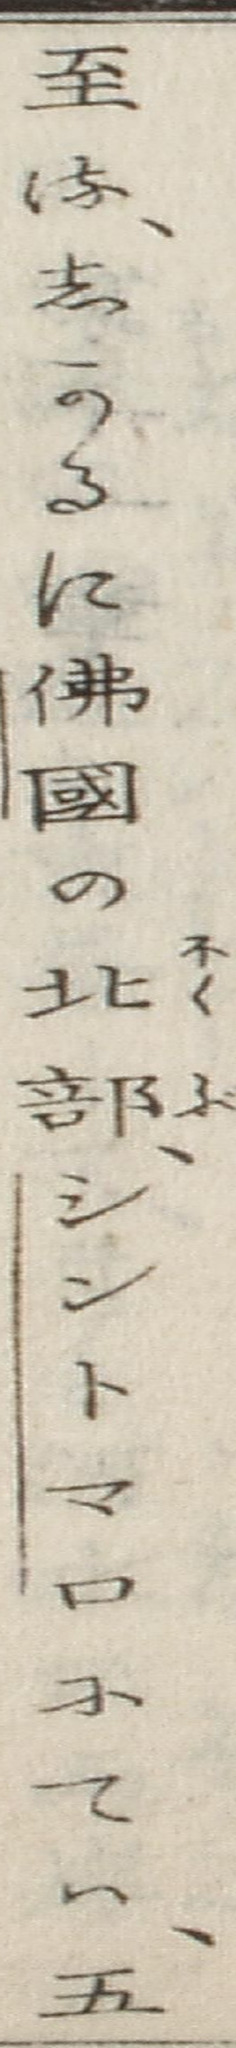至る、しかるに仏国の北部、シントマロにては、五
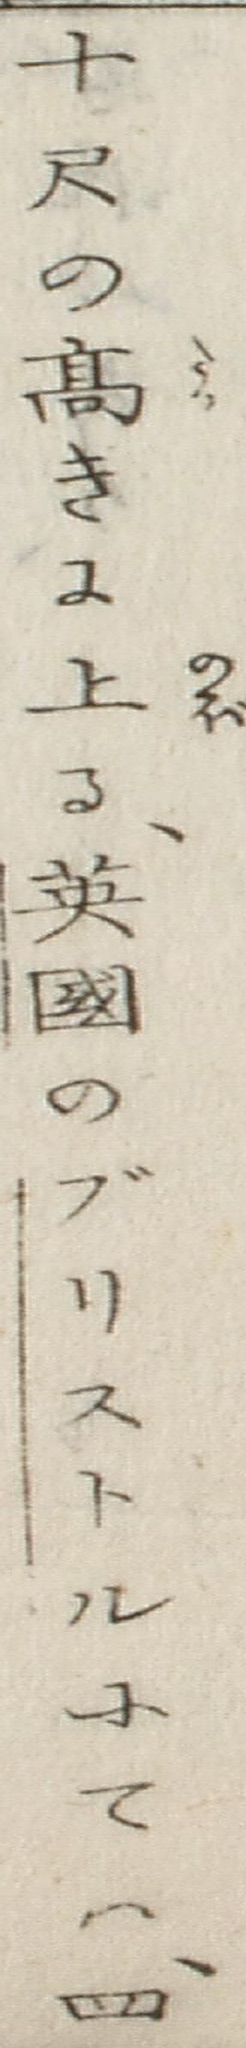十尺の高きに上る、英国のブリストルにては、四
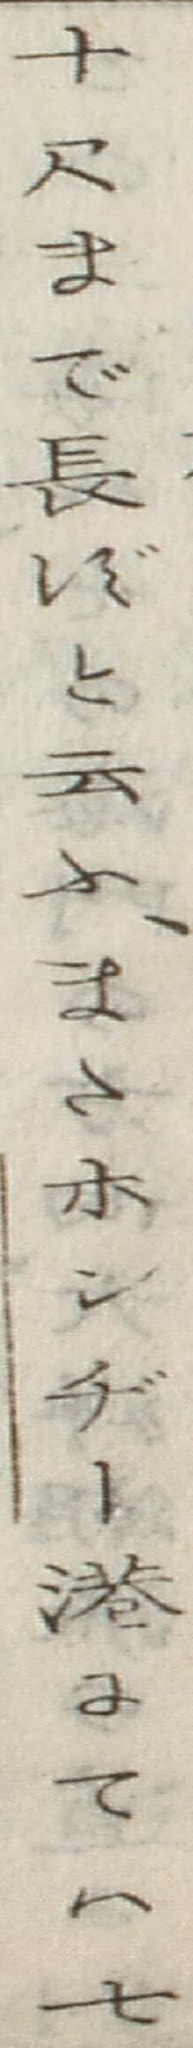十尺まで長ずと云ふ、またホンヂー港にては七
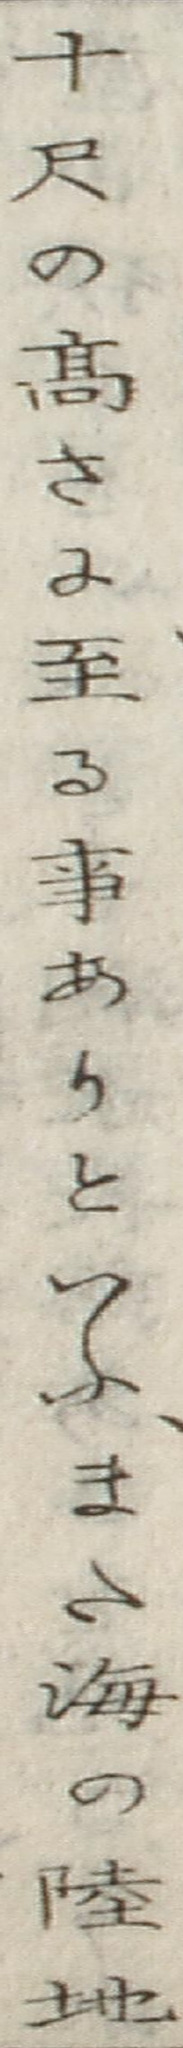十尺の高さに至る事ありといふ、また海の陸地
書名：訓蒙　天然地理學　中
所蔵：東京大学地震研究所図書室 Earthquake Research Institute Library, The University of Tokyo, JAPAN
